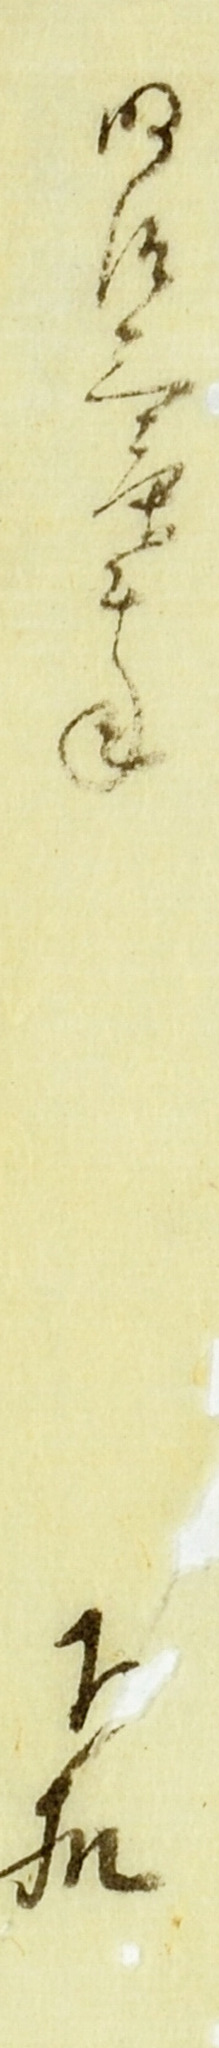明治三庚午年下扣
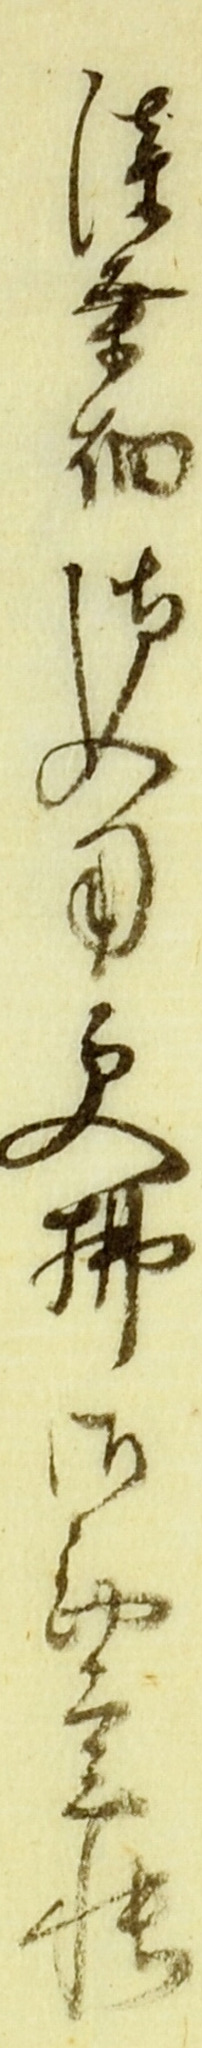漆桑畑御入用受払御勘定帳
